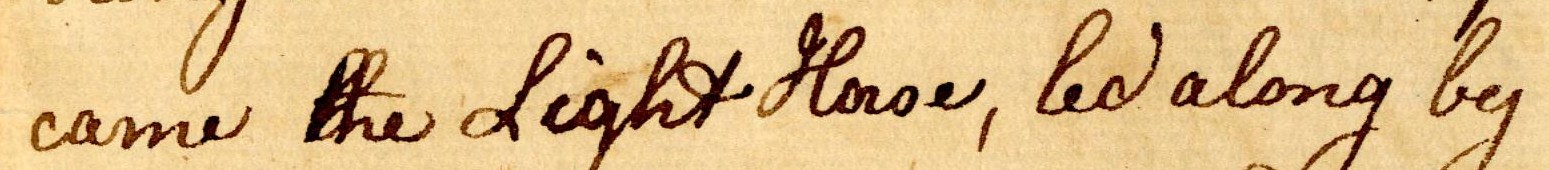came the Light Horse, led along by
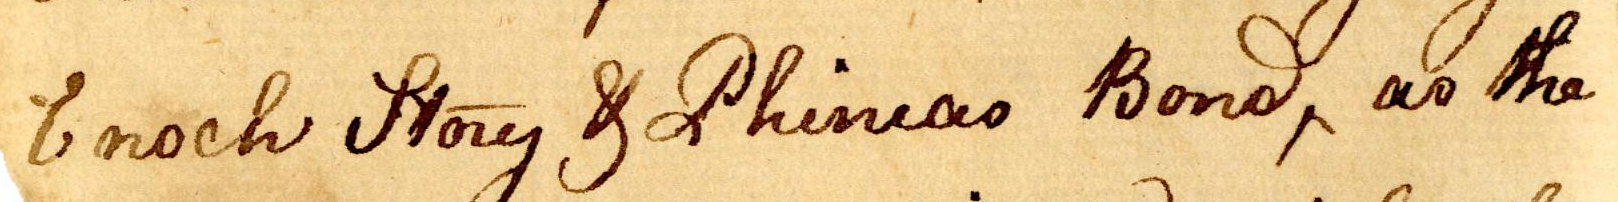Enoch Story & Phineas Bond, as the
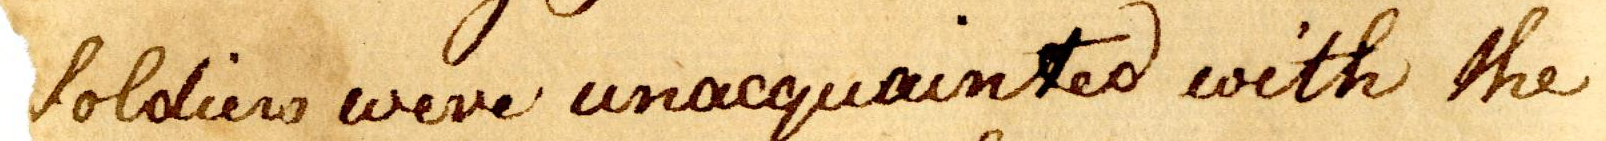Soldiers were unacquainted with the
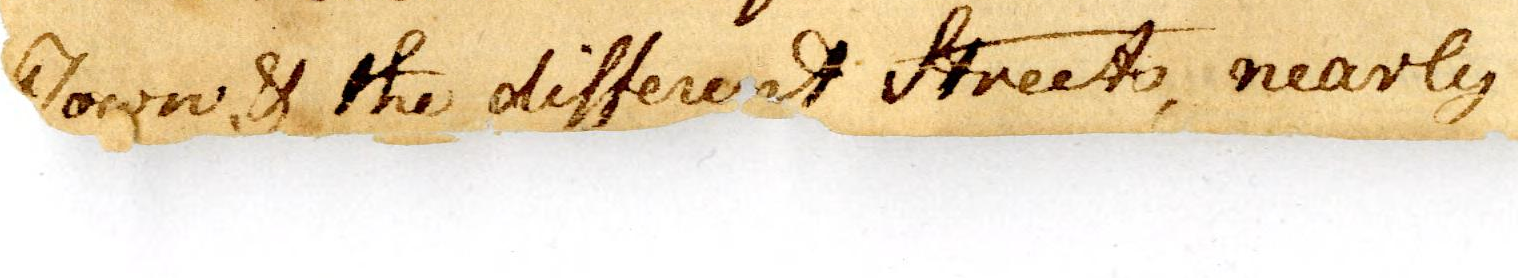Town & the different Streets, nearly
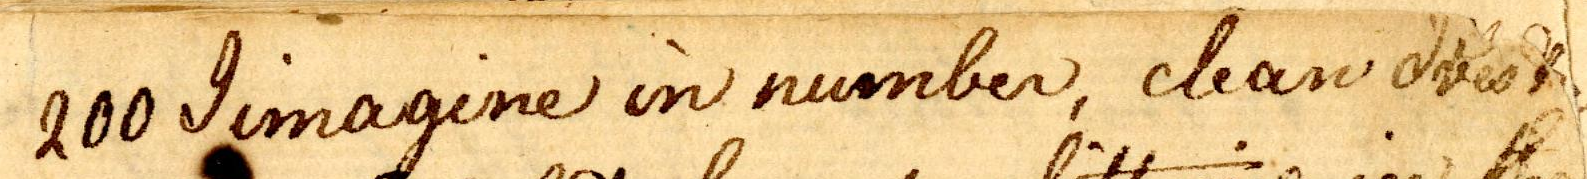200 I imagine in number, clean dres[t]
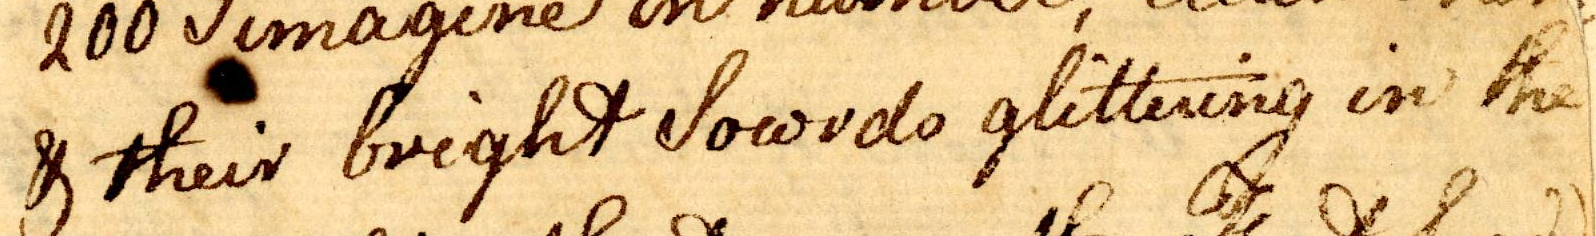& their bright Sowrds glittering in the
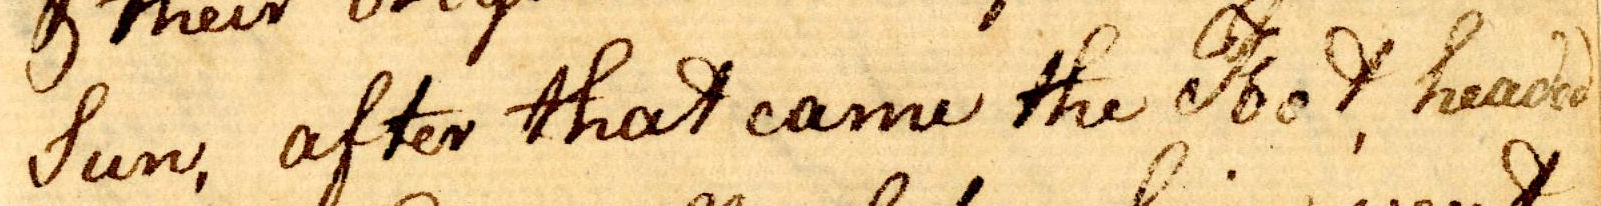Sun, after that came the Foot headed
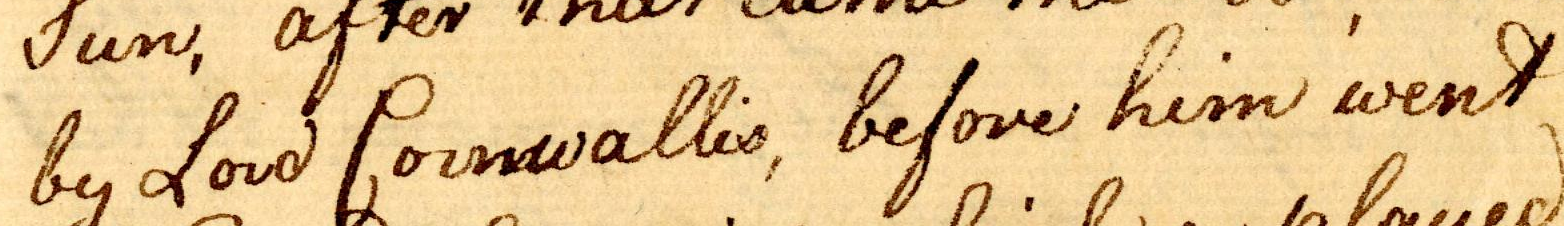by Lord Cornwallis, before him went
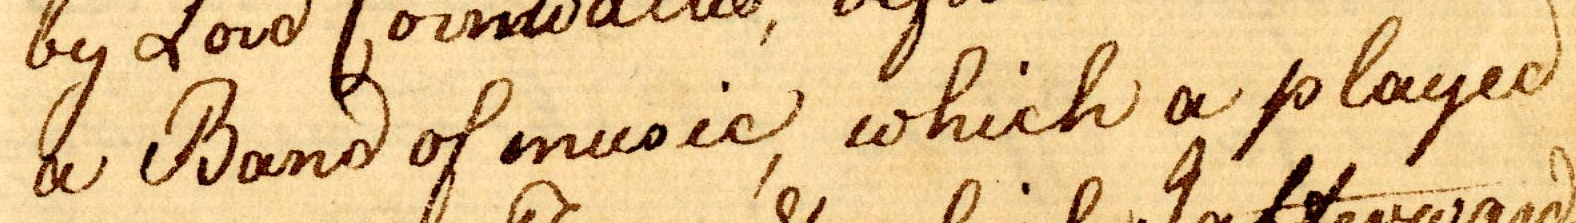a Band of music, which a played
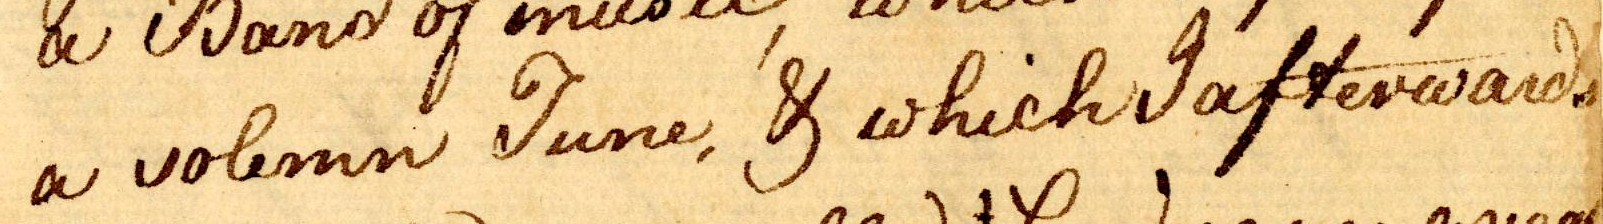a solemn Tune, & which I afterwards
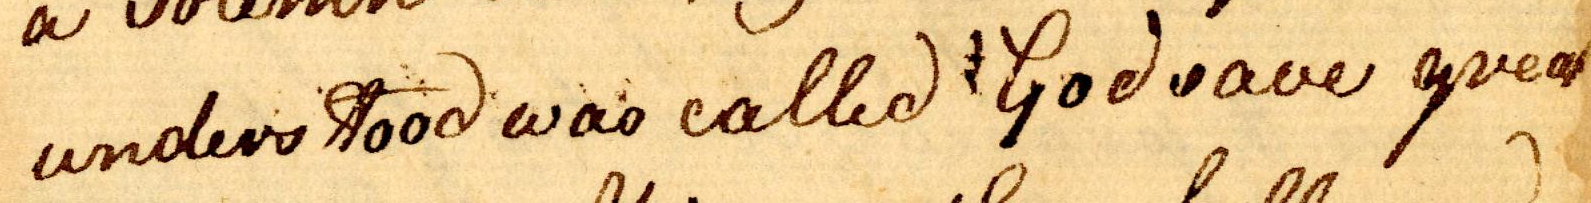understood was called "God save great
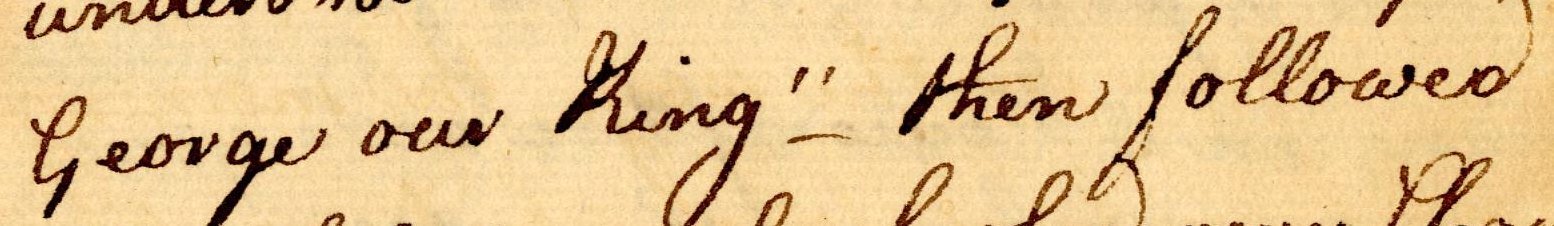George our King"- then followed
